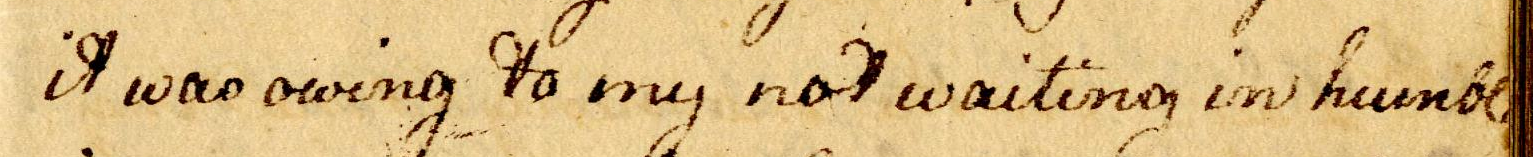it was owing to my not waiting in humbl
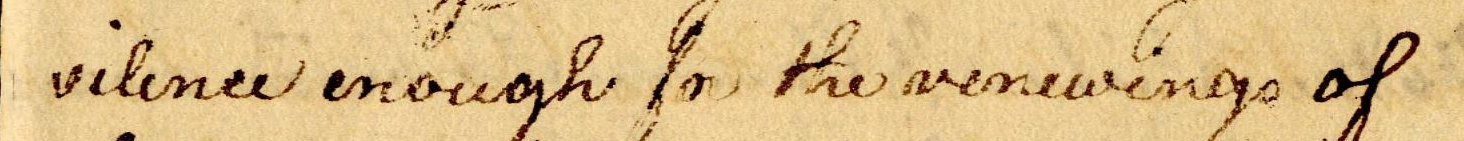silence enough for the renewings of
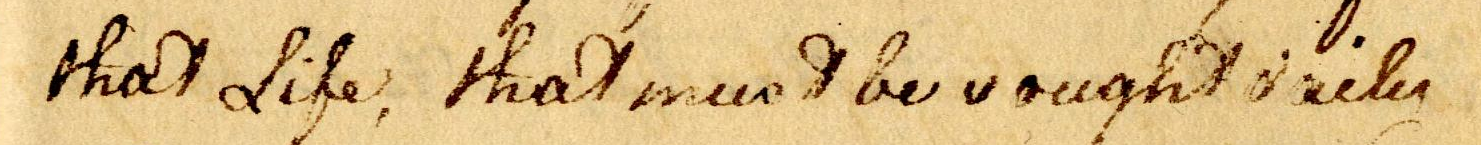that Life, that must be sought daily
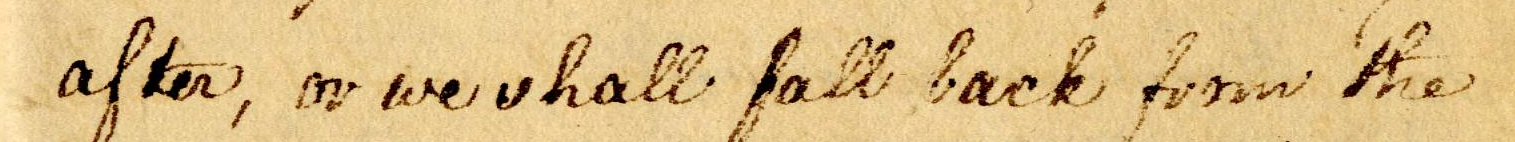after, or we shall fall back from the
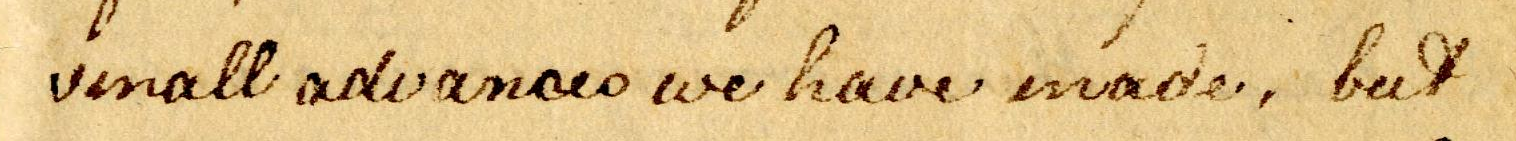small advances we have made, but
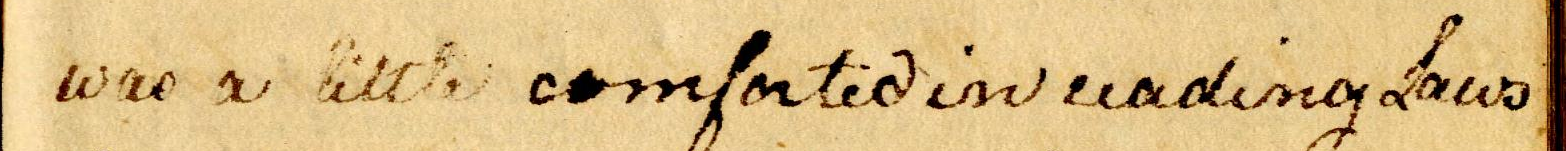was a little comforted in reading Laws
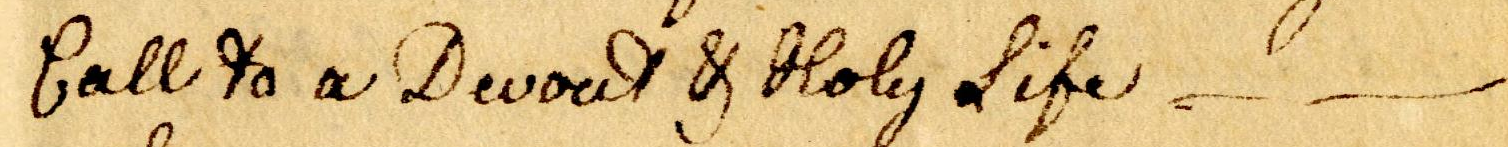Call to a Devout & Holy Life-
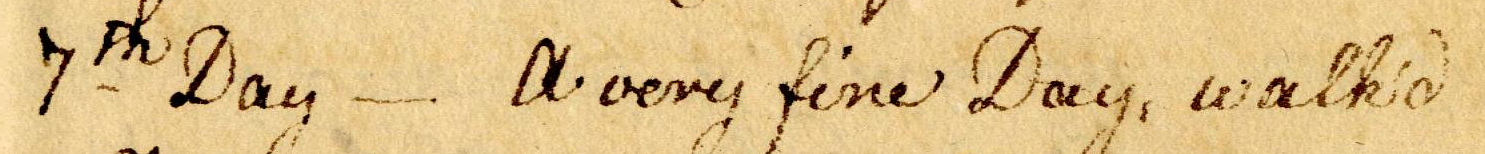7^th Day- A very fine Day, walk'd
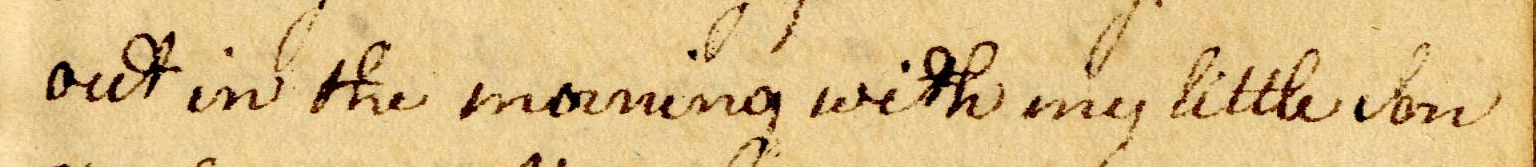out in the morning with my little Son
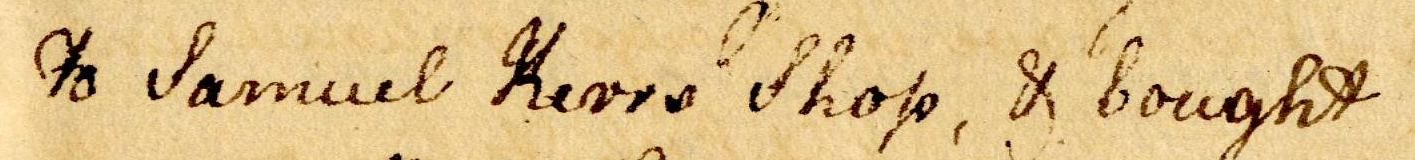to Samuel Kerrs Shop, & bought
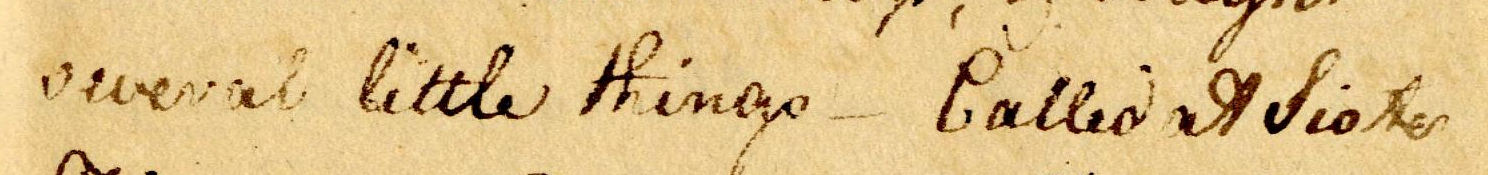several little things- Called at Sister
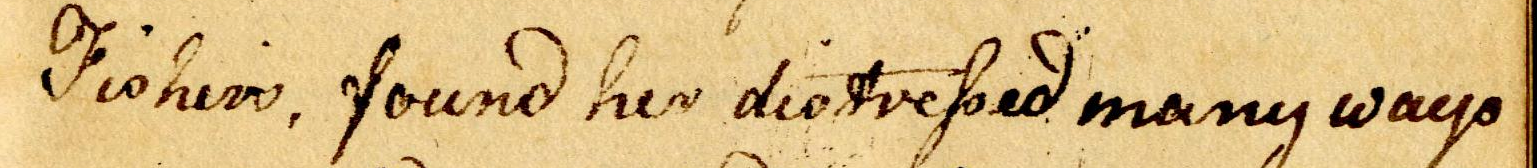Fishers, found her distressed many ways
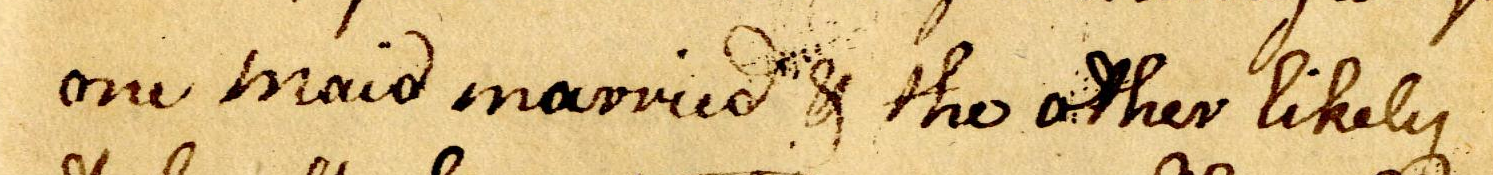one maid married & the other likely
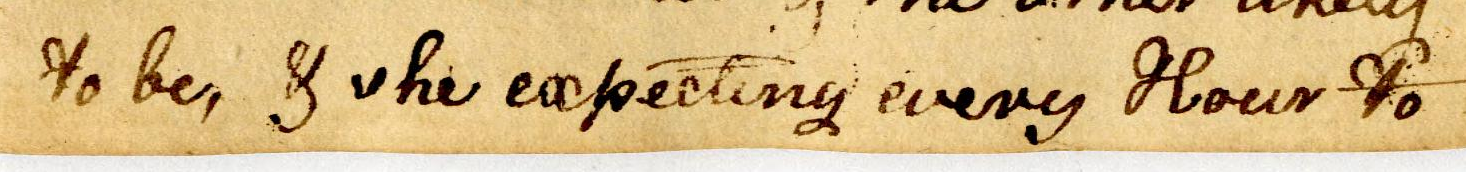to be, & she expecting every Hour to
